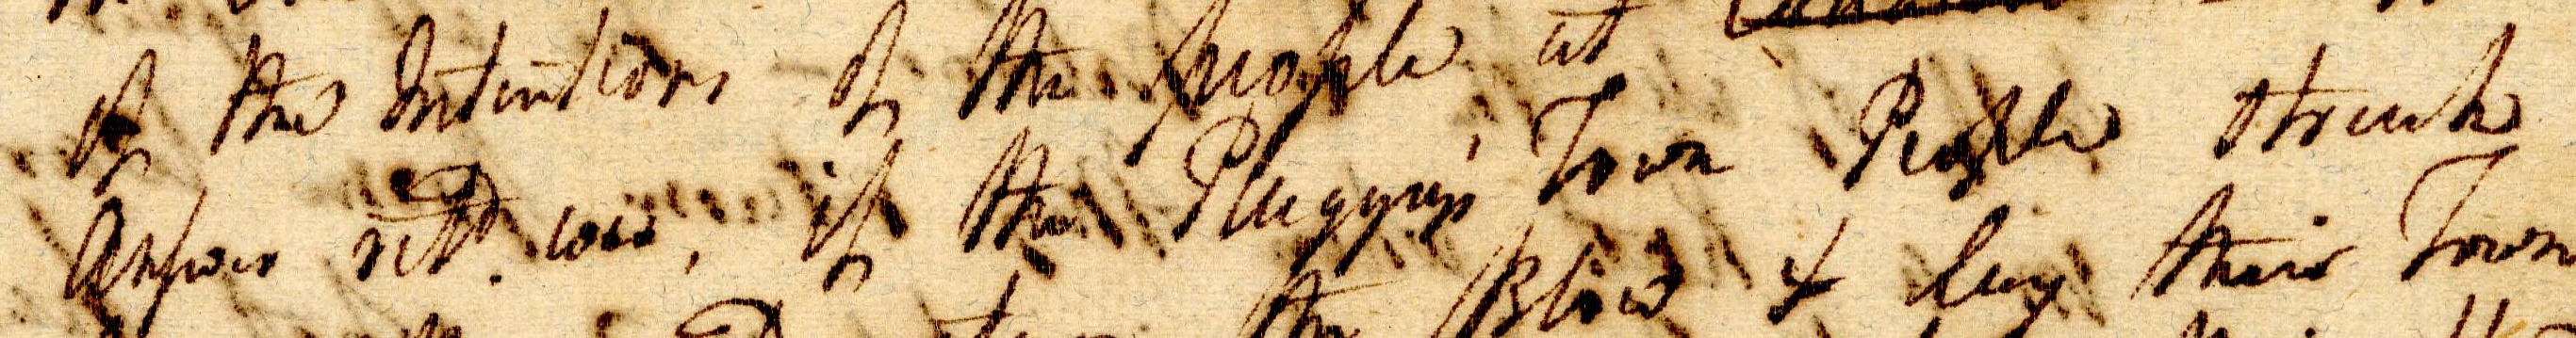Answer rec^d us, if the Pluggey's Town People strike
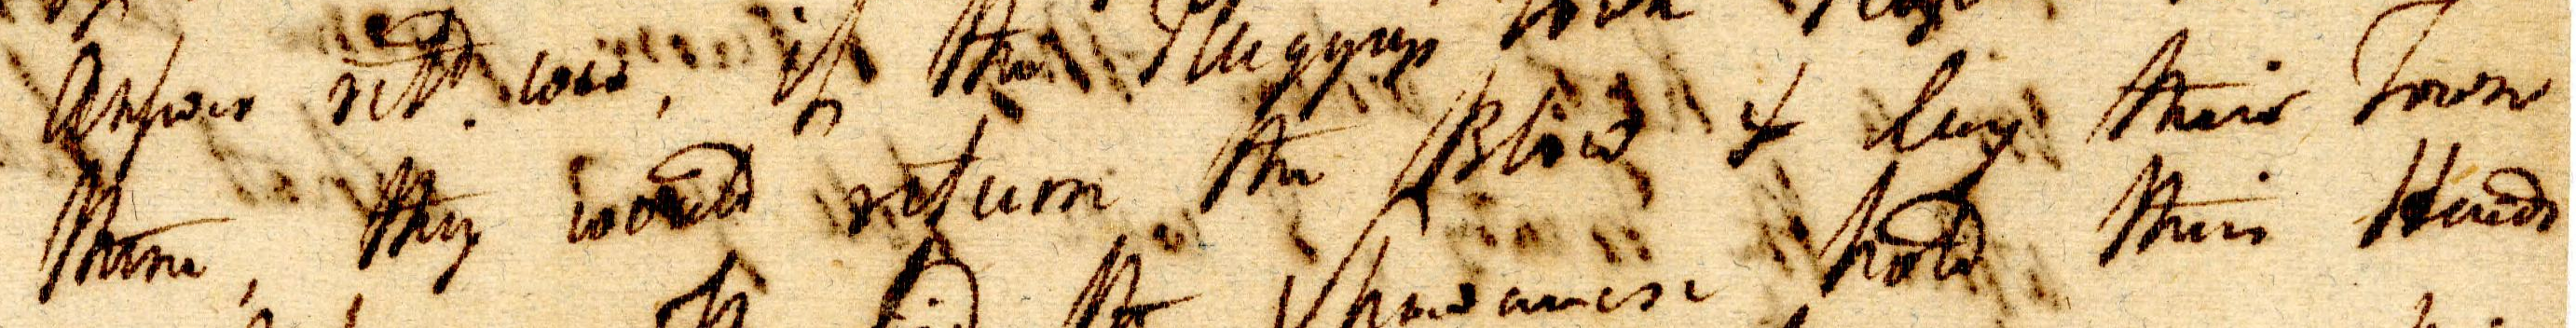them, they would return the Blow & lay their Town
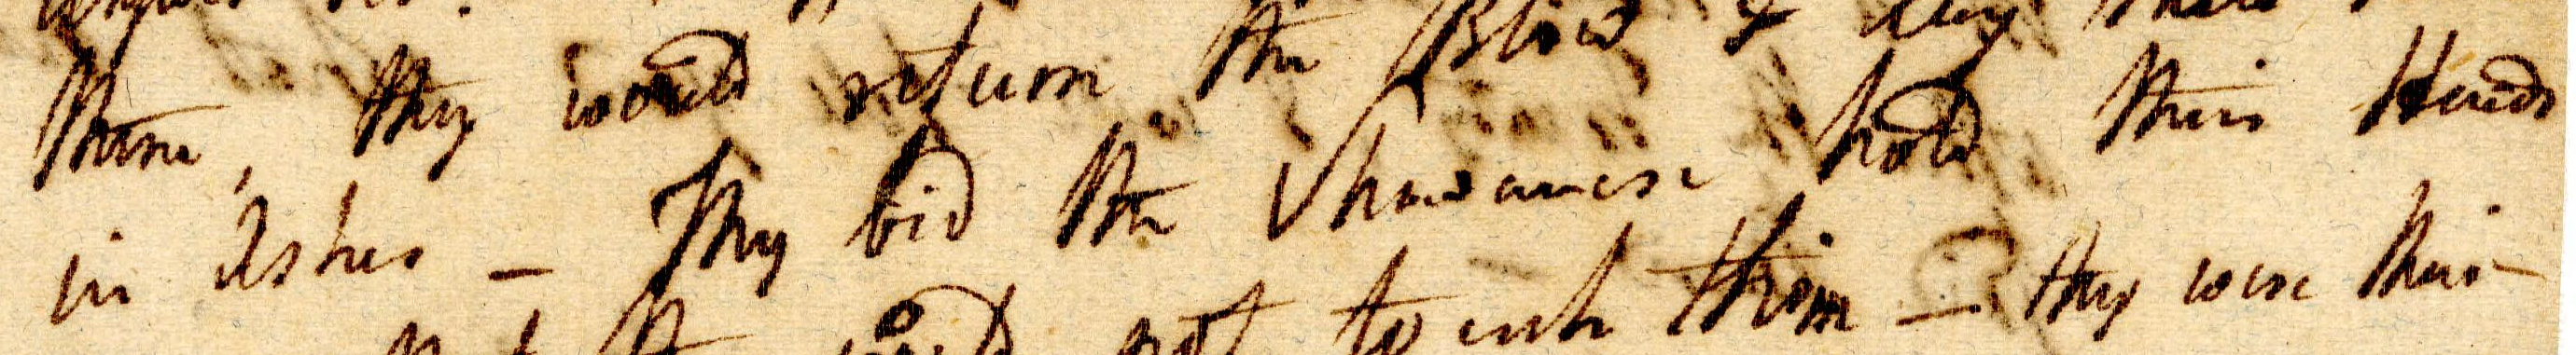in Ashes- They bid the Shawanese hold their Heads
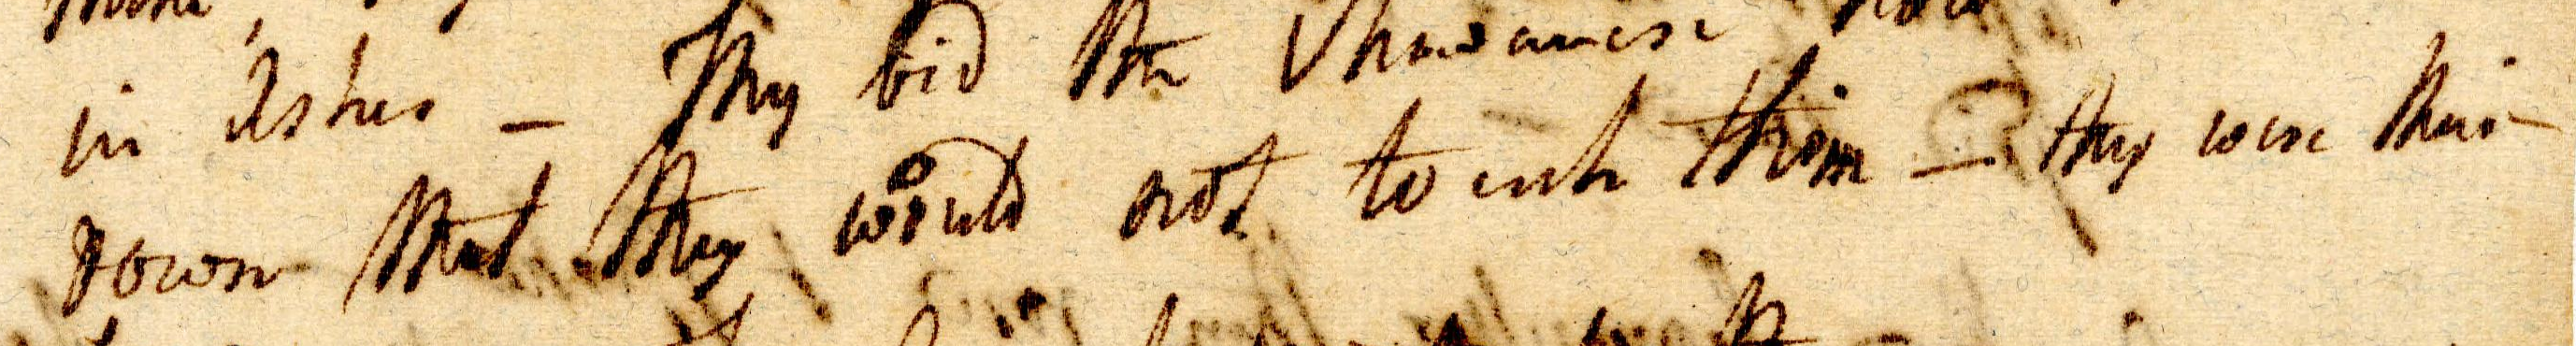down that they would not touch them- they were their
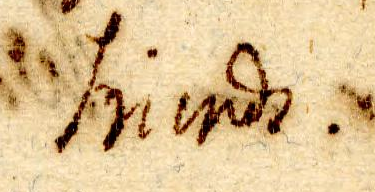Friends.-
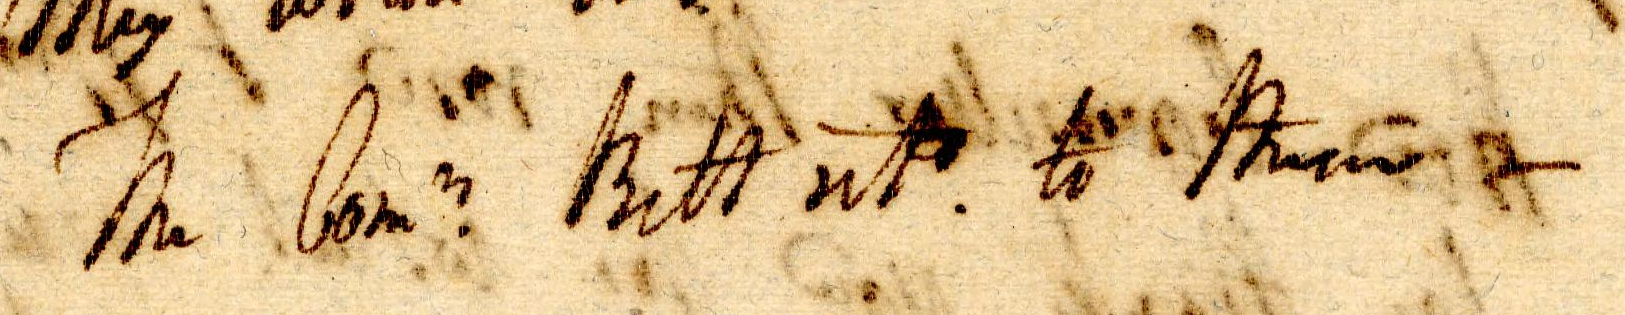The Com^r. Belt rt^d to them-
